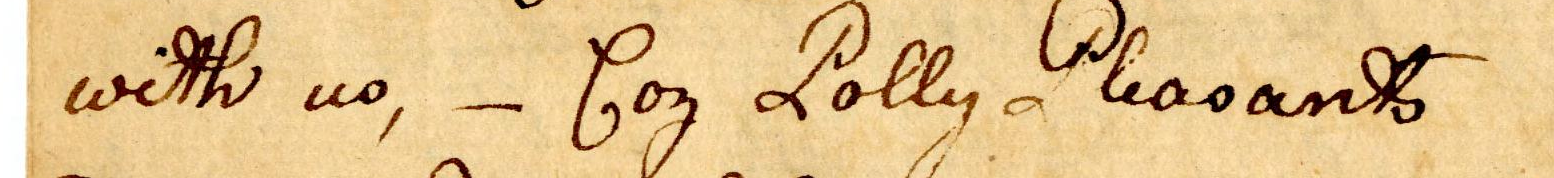with us,- Coz Polly Pleasants
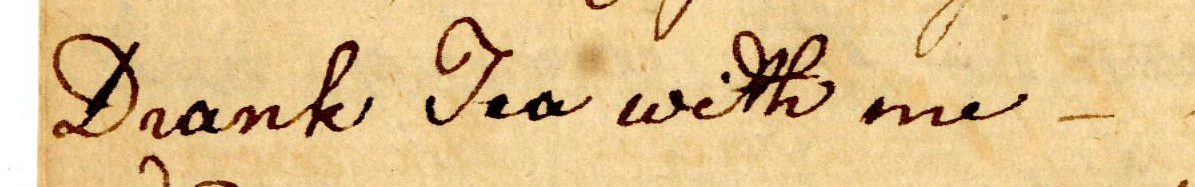Drank Tea with me
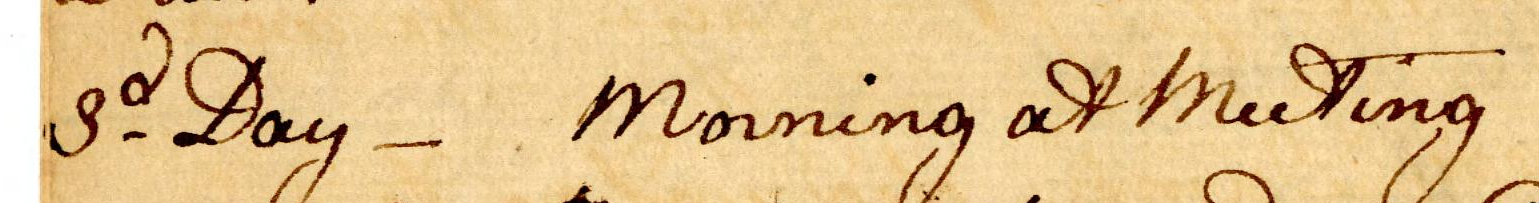3^d. Day- Morning at Meeting
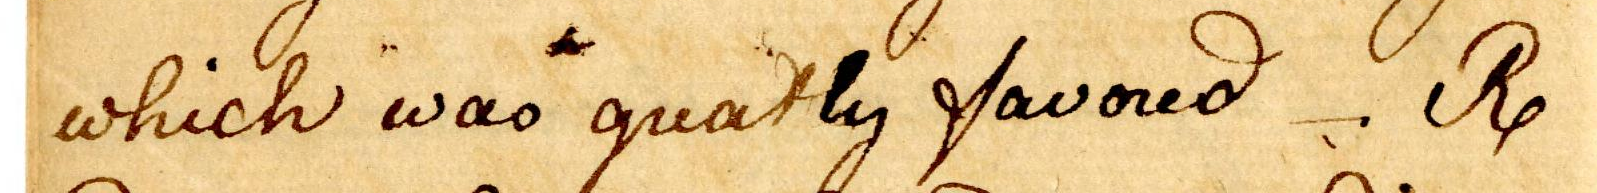which was greatly favored- R
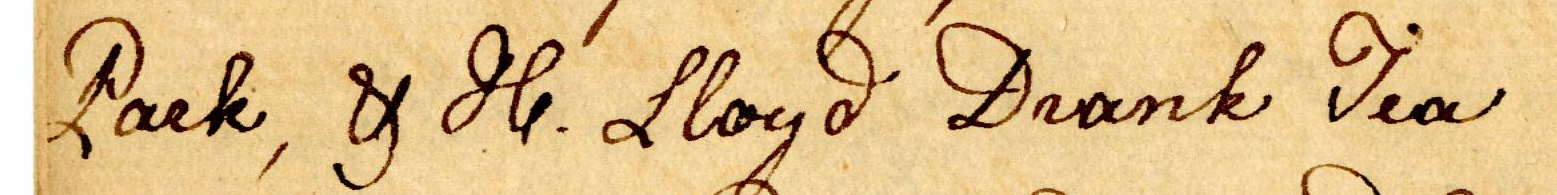Pack, & H. Lloyd Drank Tea
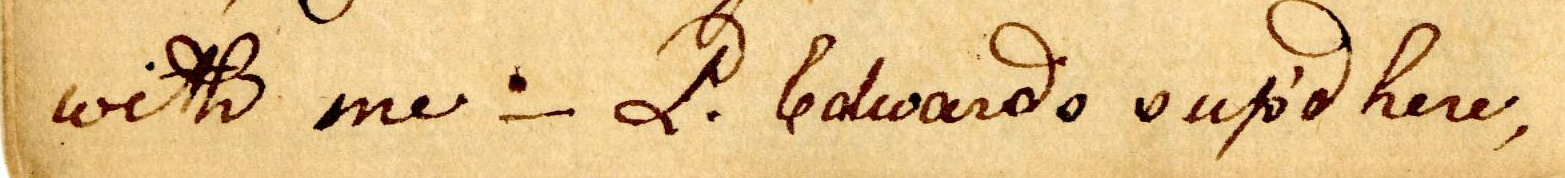with me- P. Edwards sup'd here,
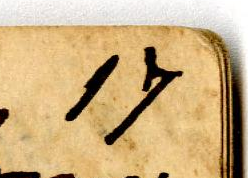17
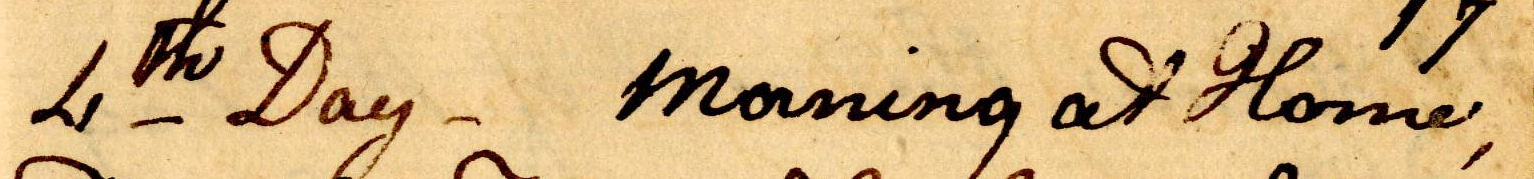4^th Day- morning at Home,
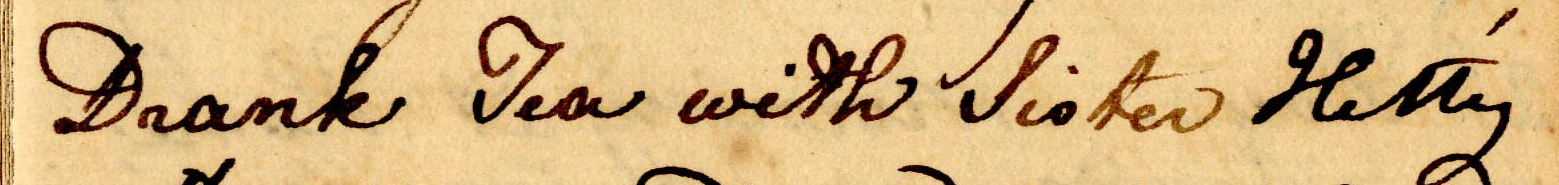Drank Tea with Sister Hetty
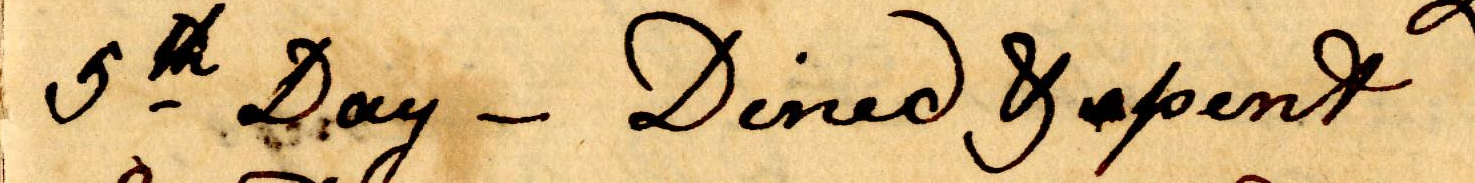5^th Day- Dined & spent
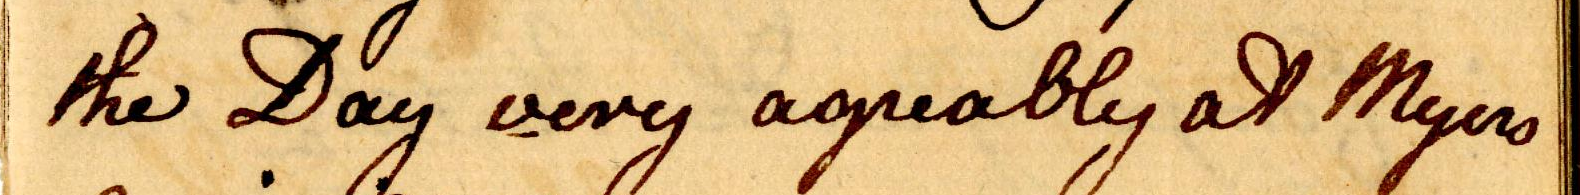the Day very agreably at Myers
